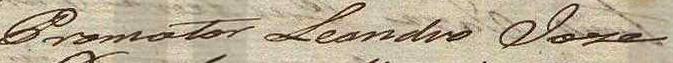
Promotor Leandro Ioze
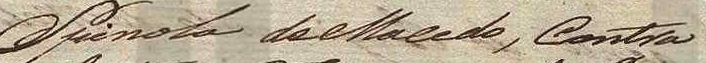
Spinola de Macedo, Contra
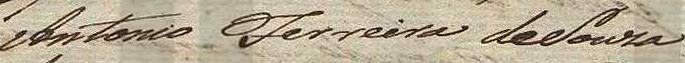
Antonio Ferreira de Souza
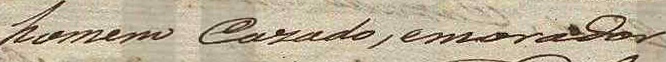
homem Cazado, e morador
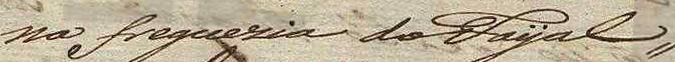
na freguezia do Fayal
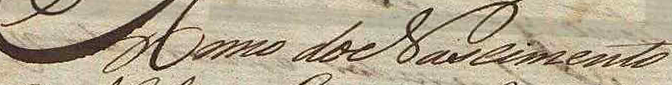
Anno do Nascimento
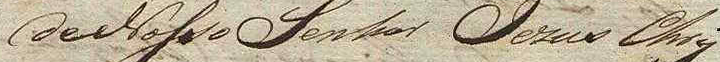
de Nosso Senhor Iezus Chris
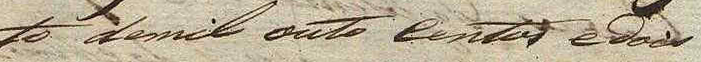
to de mil outocentos e dois
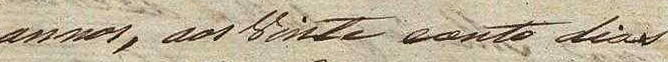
annos, aos Vinte e outo dias
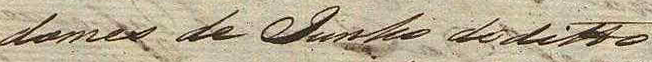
do mes de Iunho do ditto
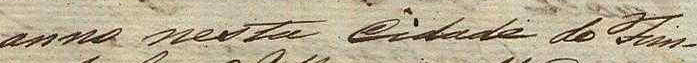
anno nesta cidade do Fun
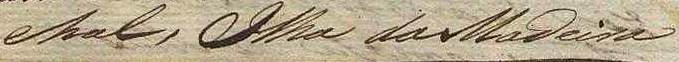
chal, Ilha da Madeira
